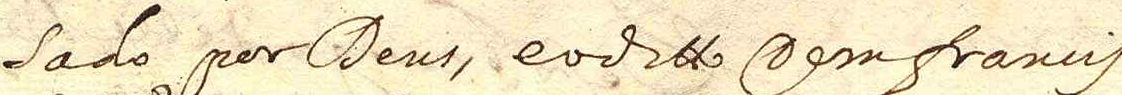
sado per Deus, e o ditto Dom francis
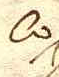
co
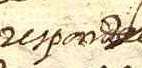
respondeo
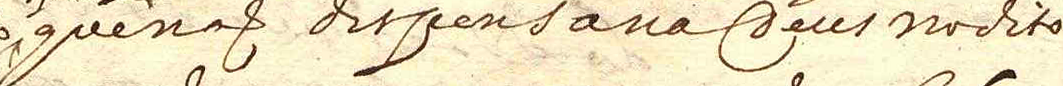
que naõ dispensaua Deus no dito
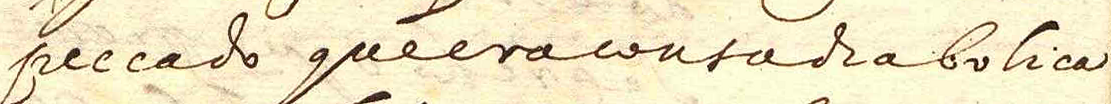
peccado que era cousa diabolica
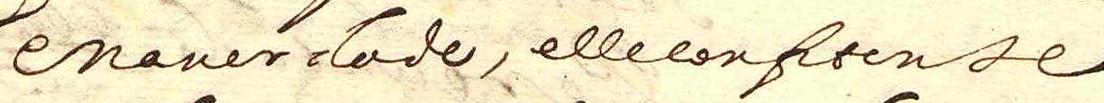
e na uerdade, elle confitente
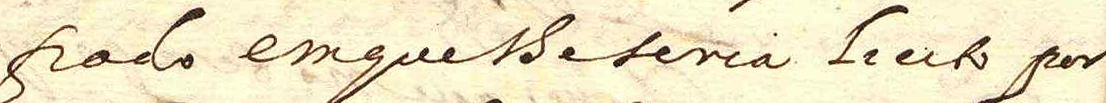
fiado em que lhe seria Licito per
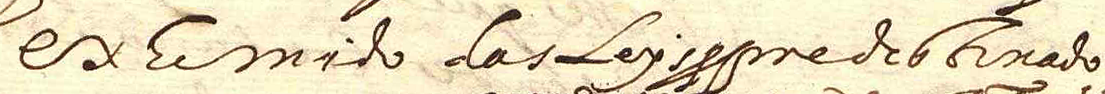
exhimido das Leys ꝓ predestinado
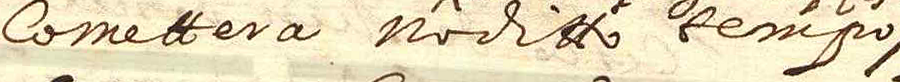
comettera no ditto tempo
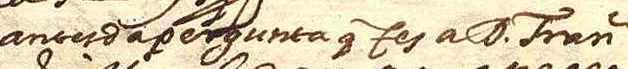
antes da pergunta q̄ fes a D. Franco
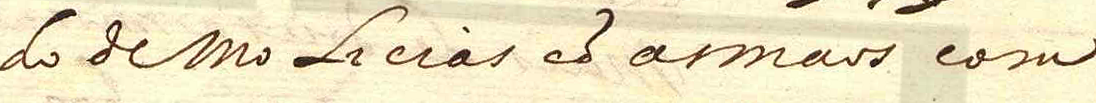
do de moLicias cō as maos com
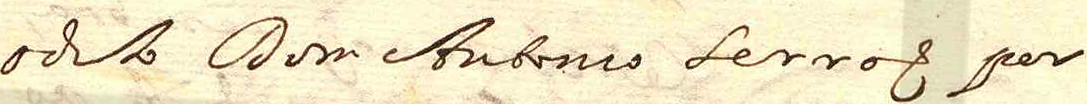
o dito Dom Antonio Serraõ per
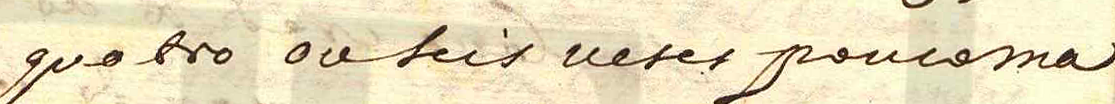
quatro ou seis ueses pouco ma
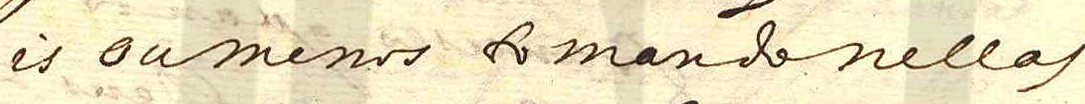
is ou menos tomando nellas
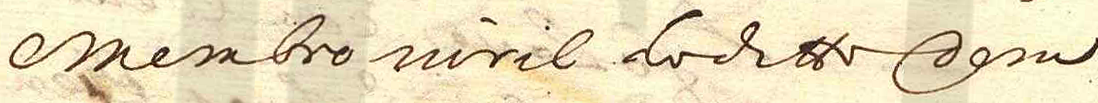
o membro uiril do ditto Dom
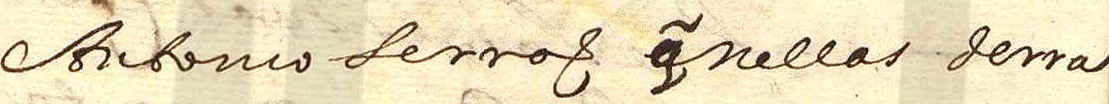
Antonio Serraõ q̄ nellas derra
